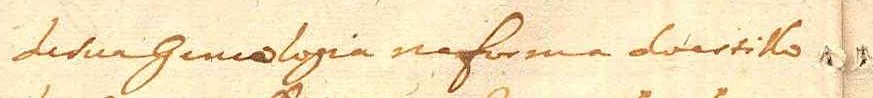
de sua geneologia na forma do estillo
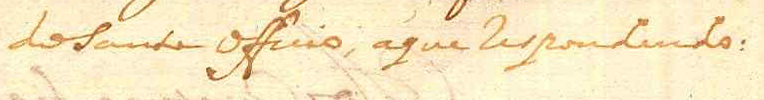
do Santo officio, a que Respondendo:
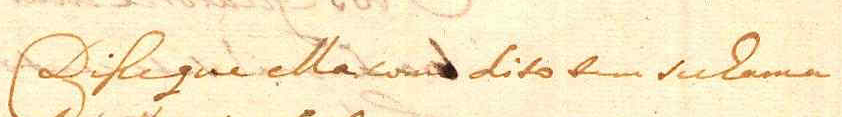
Disse que ella como dito tem se chama
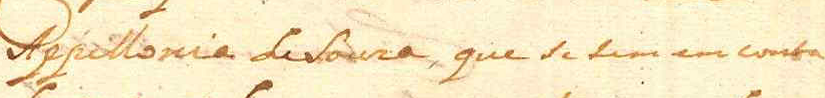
Appellonia de Souza, que se tem em conta
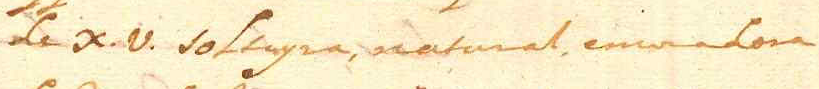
de x. v. solteyra, natural, e moradora
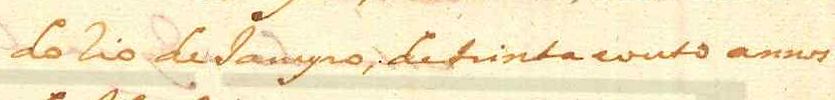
do Rio de Ianeyro, de trinta e outo annos
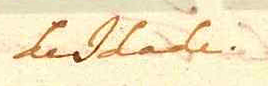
de Idade.
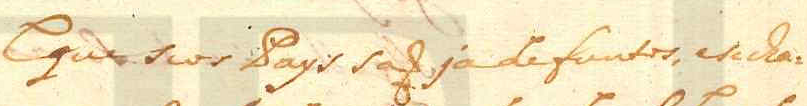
E que seos Pays saõ ja defuntos, e se cha
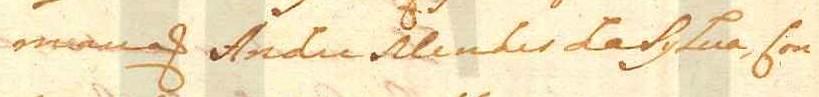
mauaõ Andre Mendes da Sylua, Con
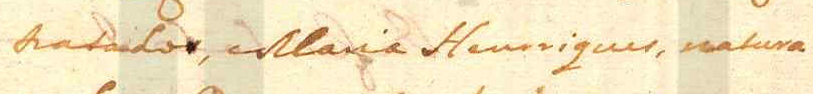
tratador, e Maria Henrriques, natura
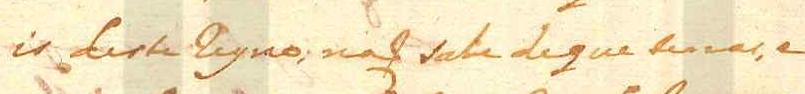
is deste Reyno; naõ sabe de que terras, e
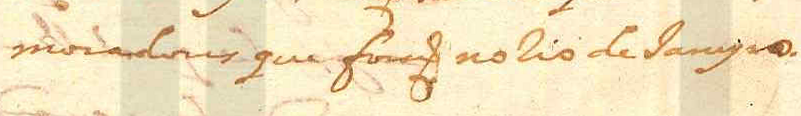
moradores que foraõ no Rio de Ianeyro.
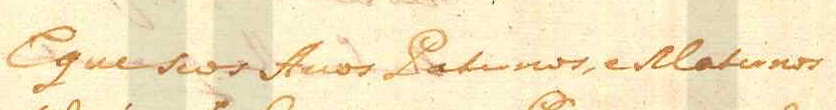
E que seos Auos Paternos, e Maternos
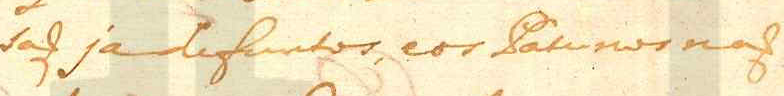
saõ ja defuntos, e os Paternos naõ
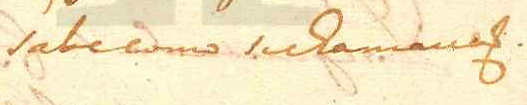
sabe como se chamauaõ.
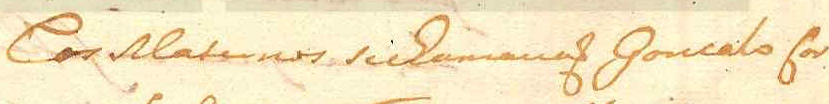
E os Maternos se chamauaõ Gonçalo Cor
